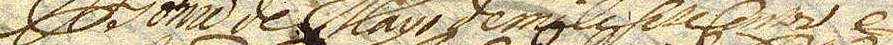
Aos onze de Mayo de mil e seteCentoz e
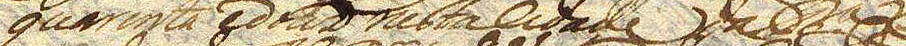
quarenta e douz nesta Cidade da Ba
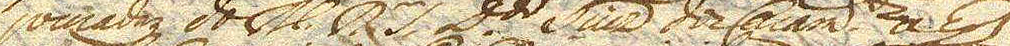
pouzadaz do M. R. rS. D.or Iuiz doz Cazamtos ahy
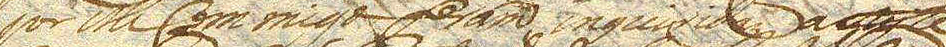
por elle Commigo foram inquiridas as teste
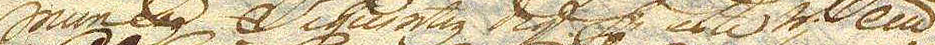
munhas Seguintez de q̄ fis este tr;o e eu
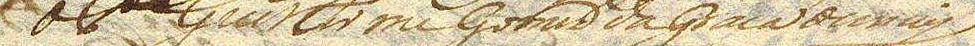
o P.e Guilherme Gomes da Graca o escrevy
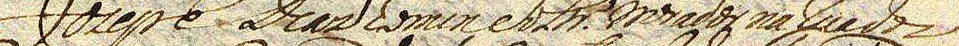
Jozeph Diaz homen soltr.o morador na Rua dos
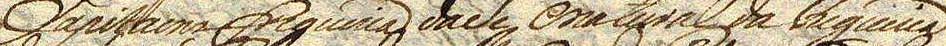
Capitaens freguezia da Se e natural da Freguezia
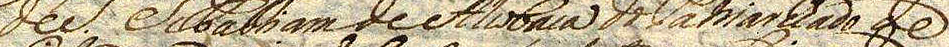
de S. Sebastiam de Alcobaça do Patriarchado de
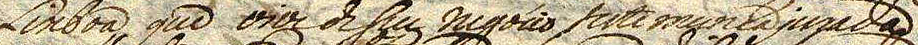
Lisboa, que vive de seu negócio testemunha jurada
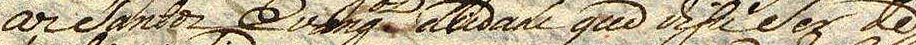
aoz Santoz Evangos de idade que disse ser de
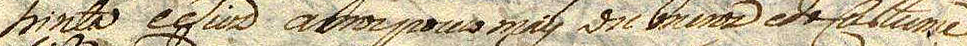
trinta e seiz annos pouco mais ou menoz e do Costume
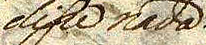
disse nada.
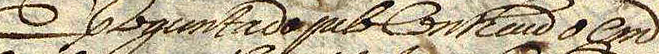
E proguntado pelo Contheudo em
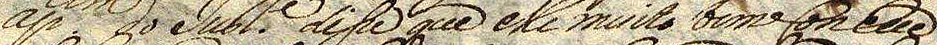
a p.am do Iust.e disse que elle muito bem o Conhece
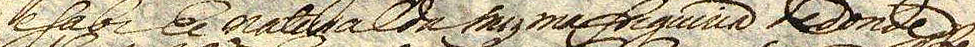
e sabe he natural da mesma freguezia de donde
